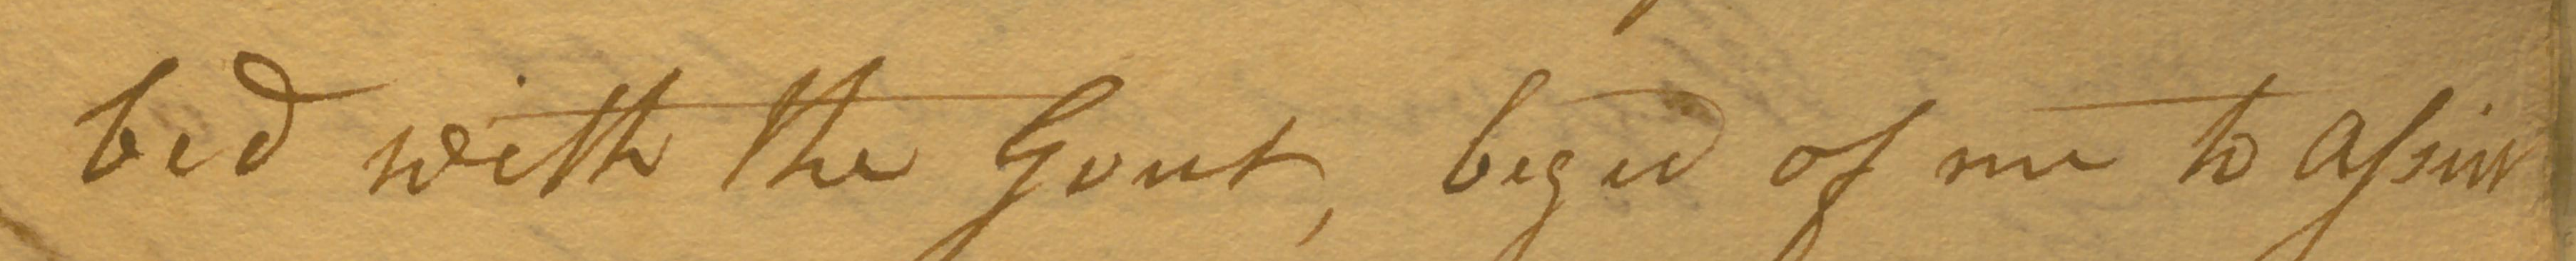bed with the Gout, beged of me to Assist
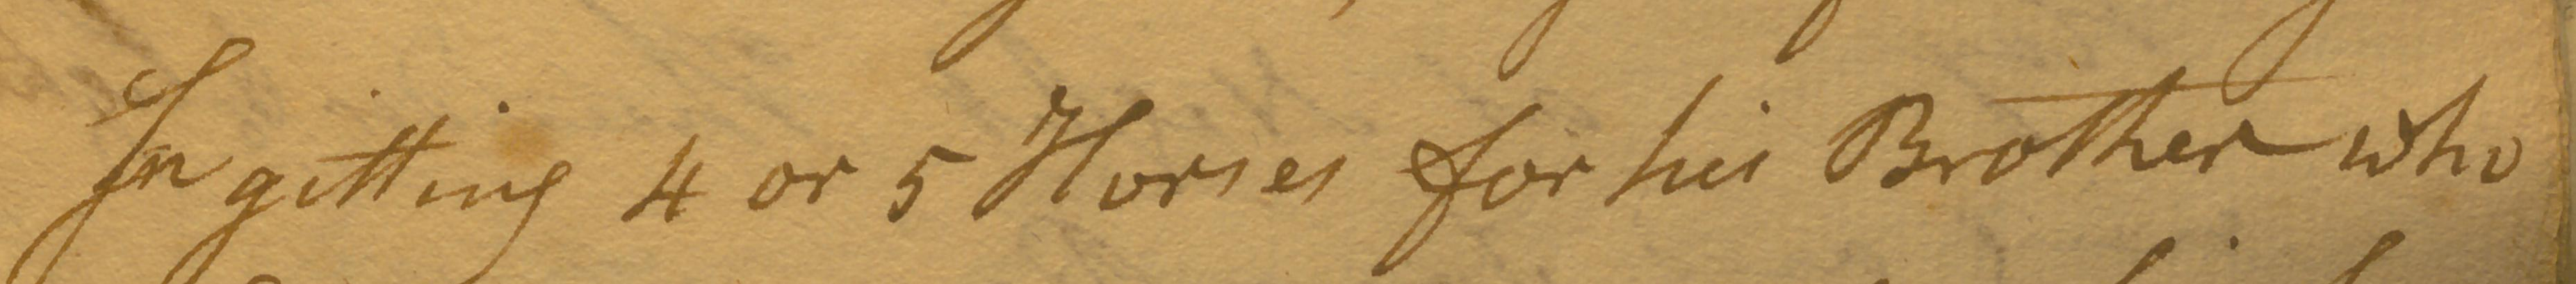for getting 4 or 5 Horses for his Brother who
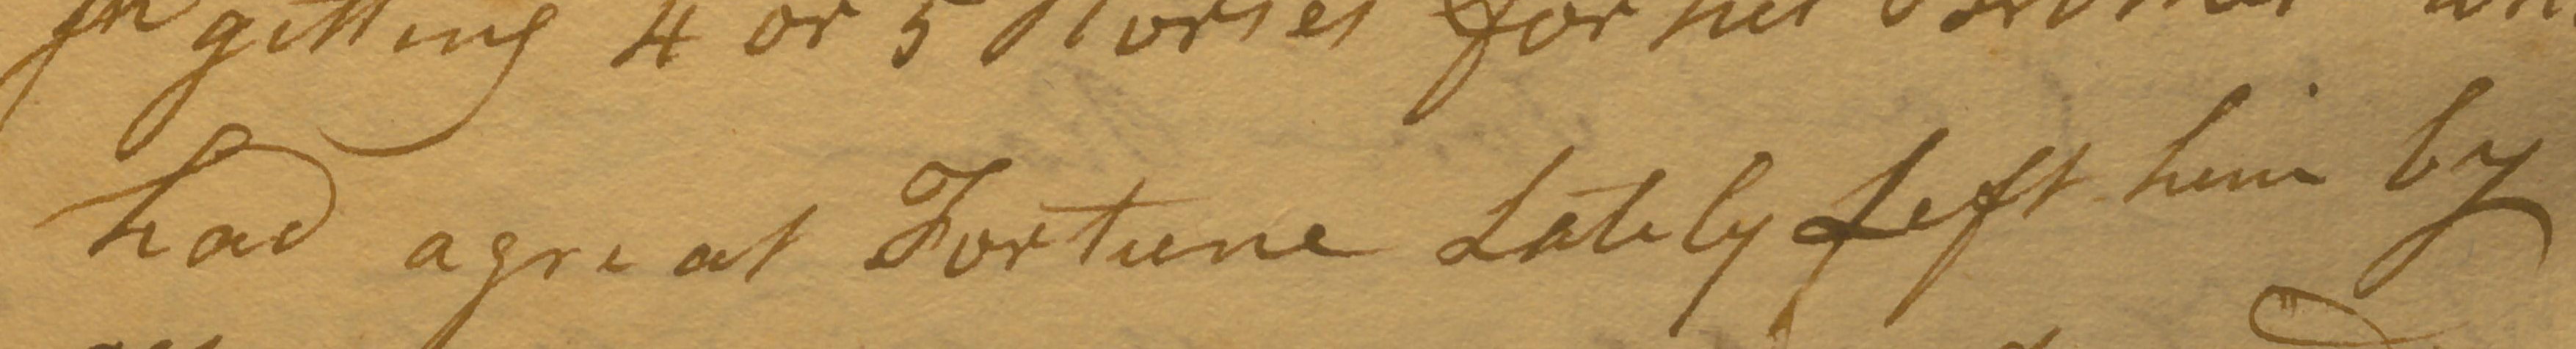had a great Fortune Lately Left him by
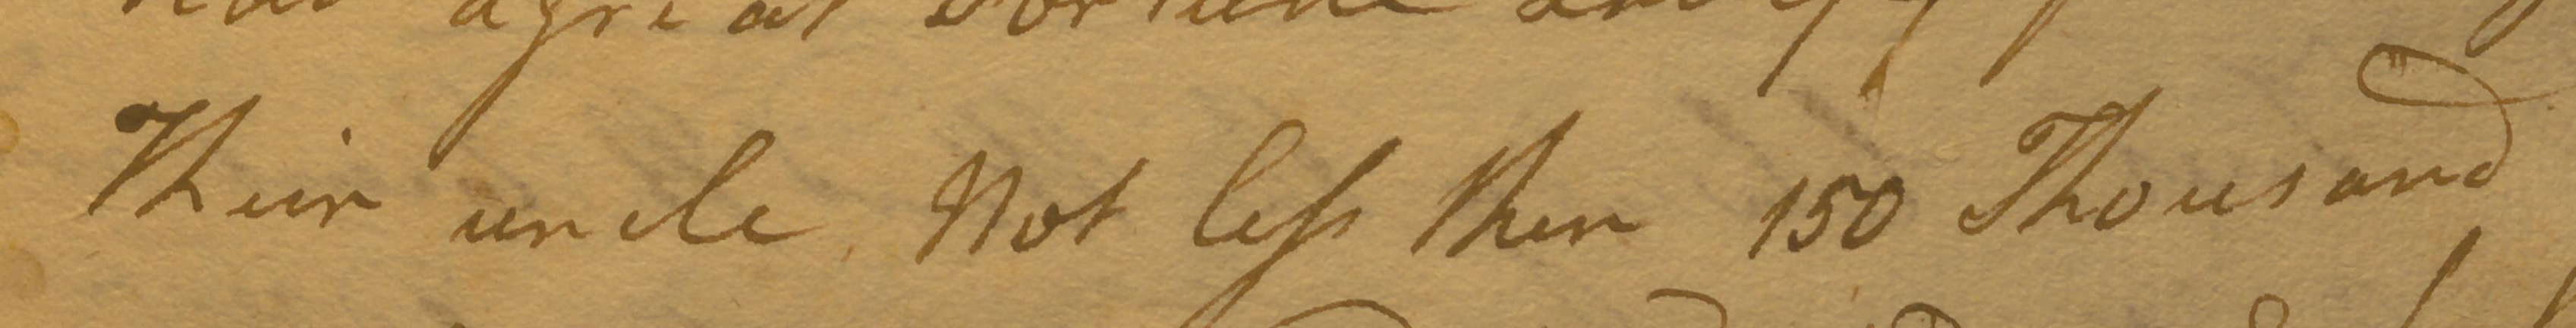Their uncle, Not less then 150 Thousand
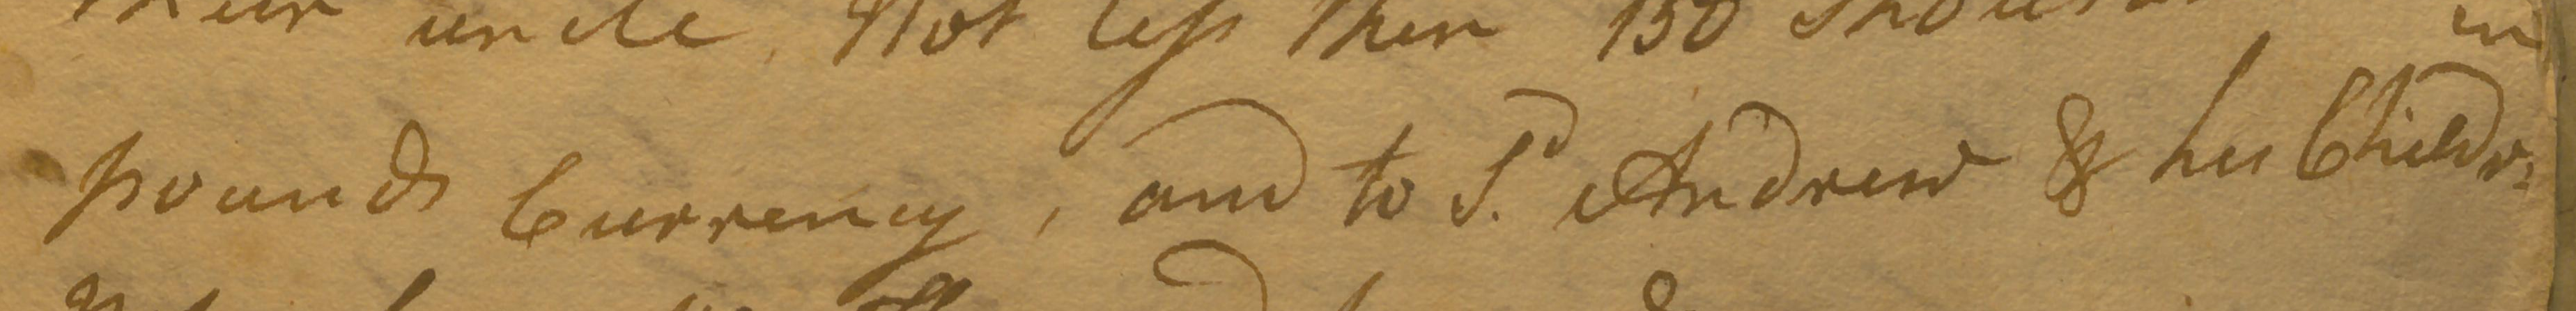pounds Curreney, and to S^d. Andrew & his Child^ren.
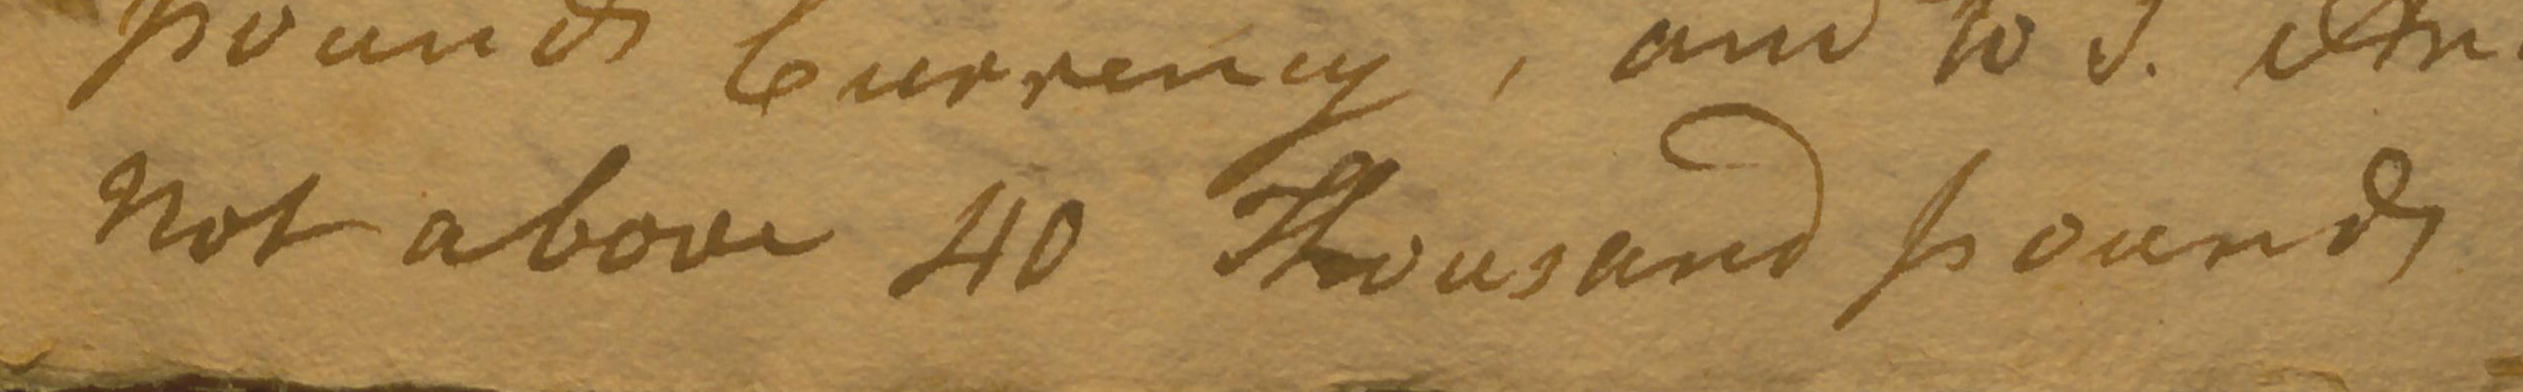not above 40 Thousand pounds
